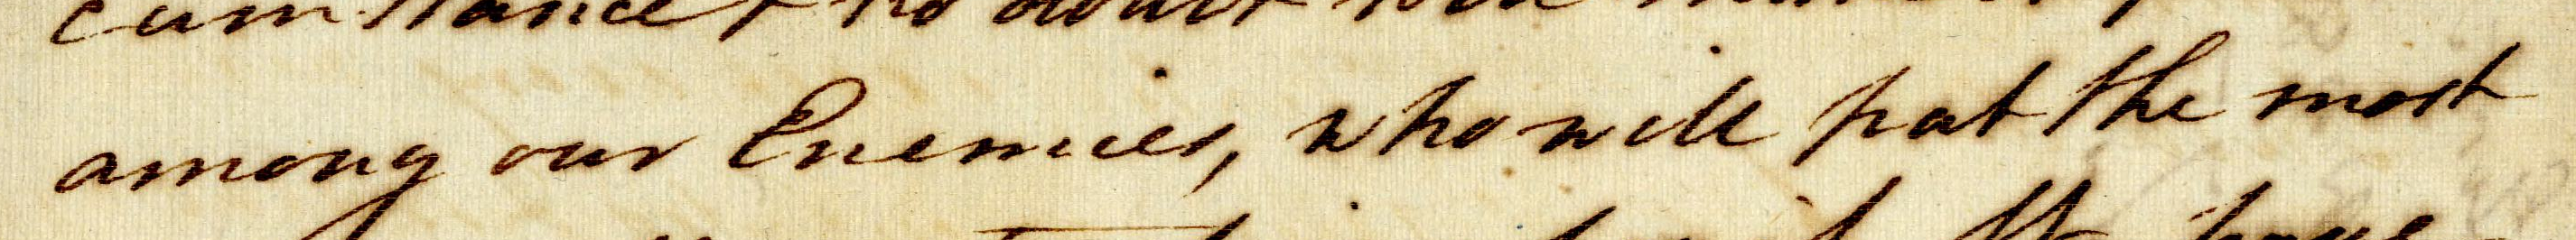among our Enemies, who will put the most
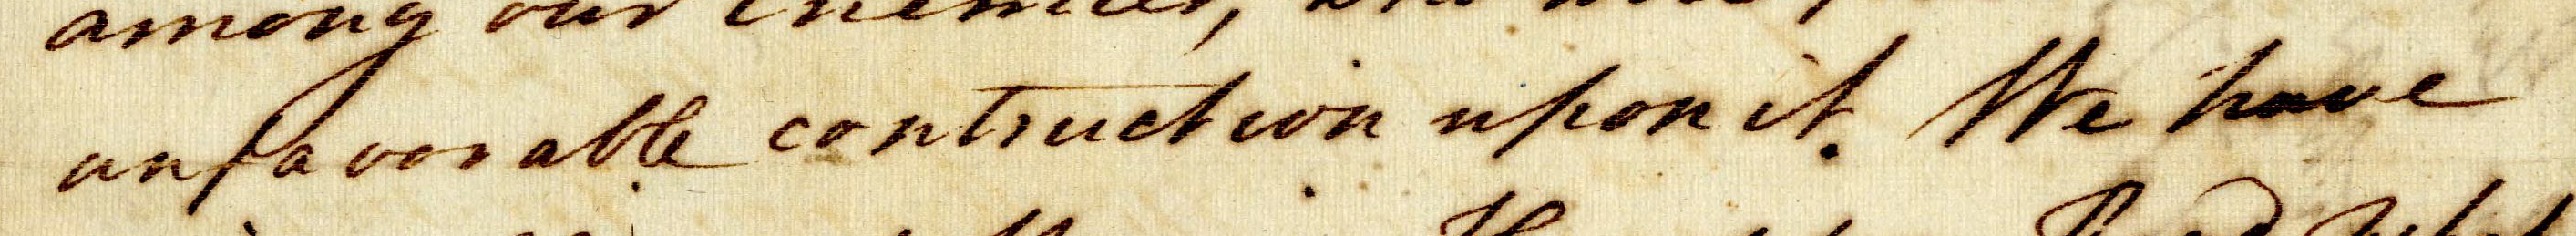unfavorable contruction upon it. We have
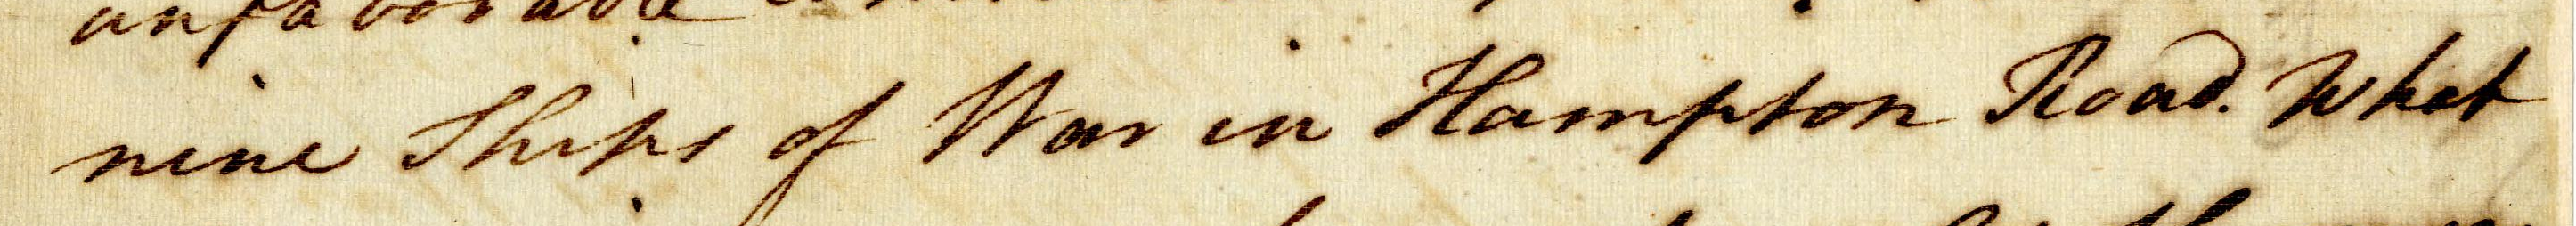nine Ships of War in Hampton Road. What
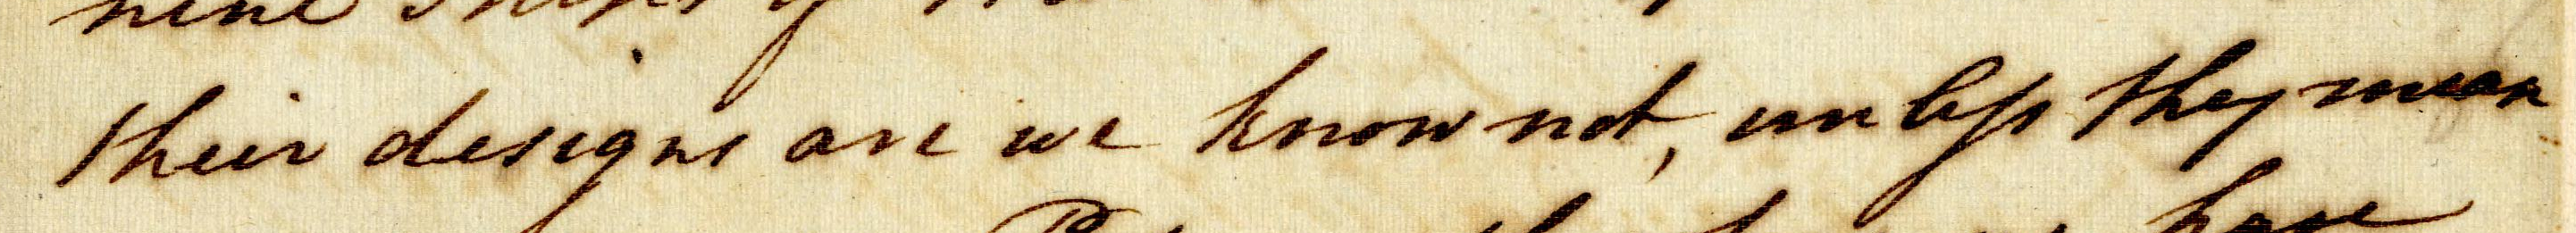their designs are we know now, unless they mean
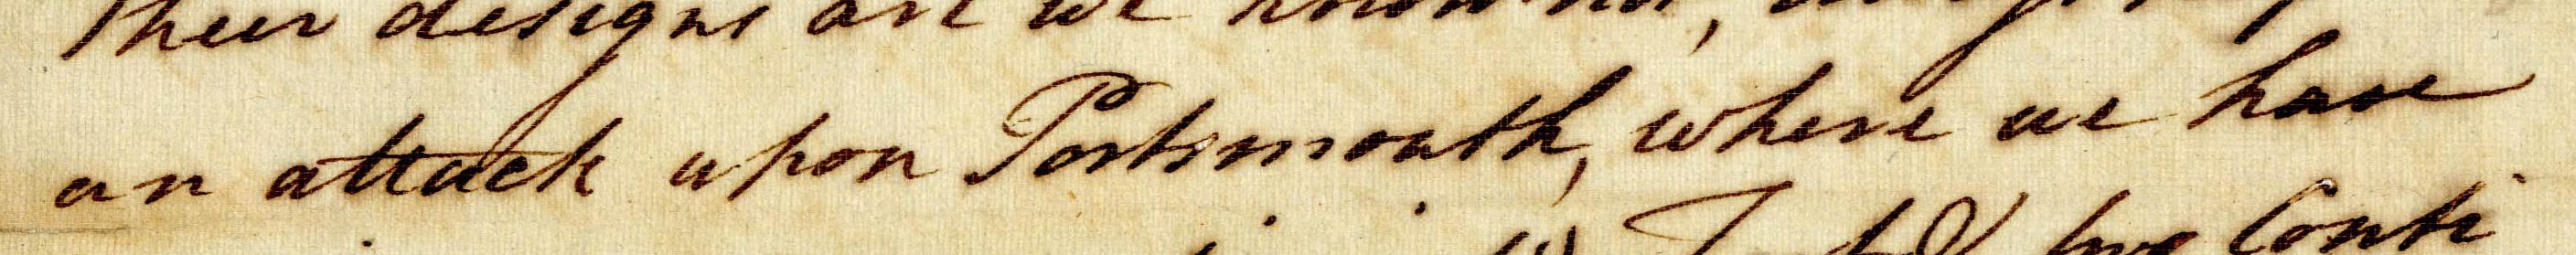an attack upon Portsmouth, where we have
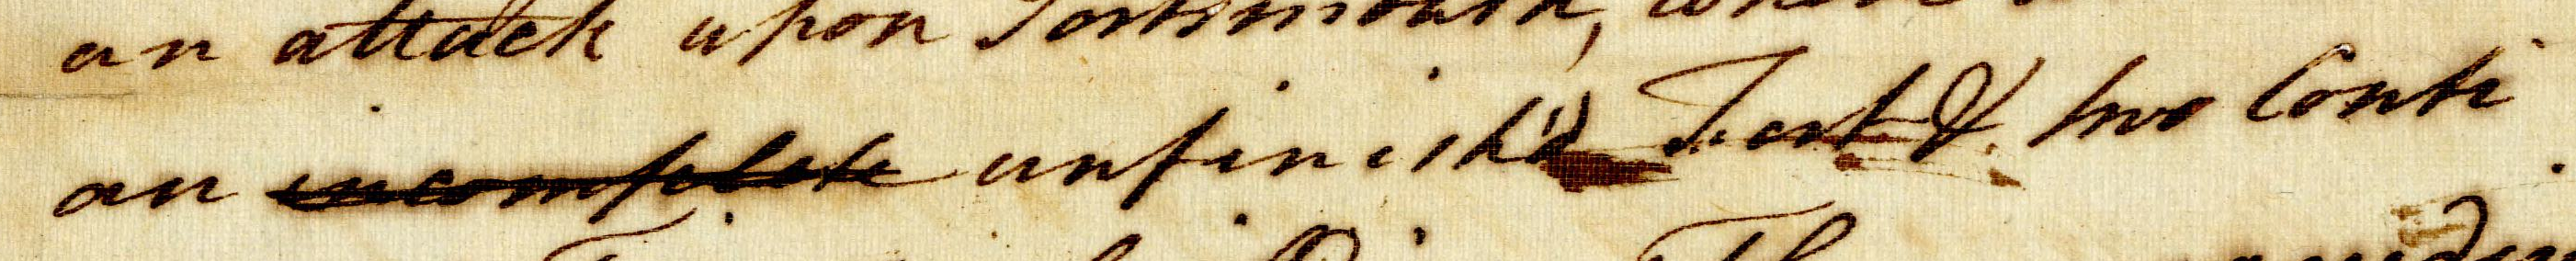an [incomplete] unfinish'd Fort & two Conti
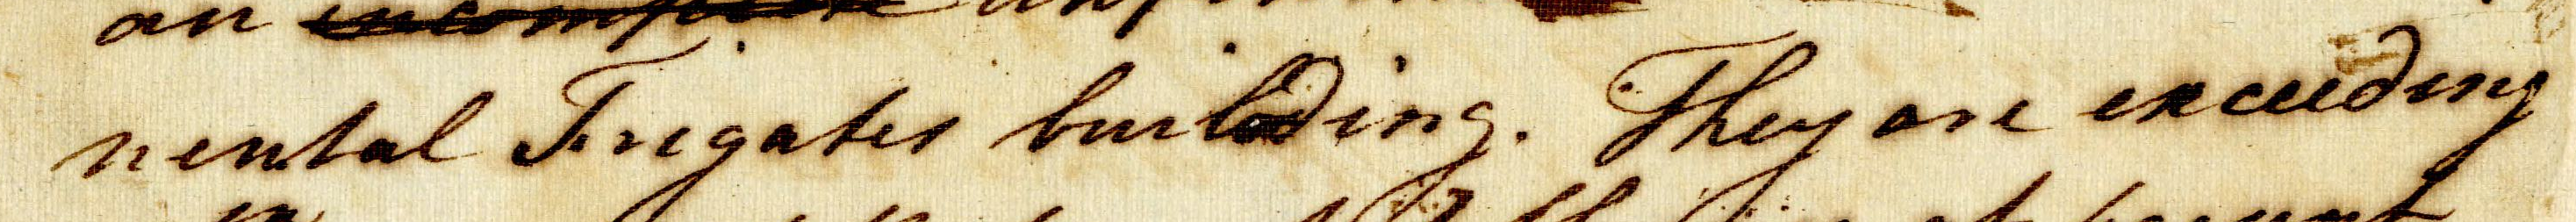nental Frigates building. They are exceeding
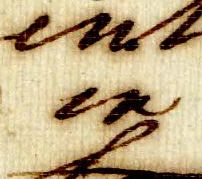in
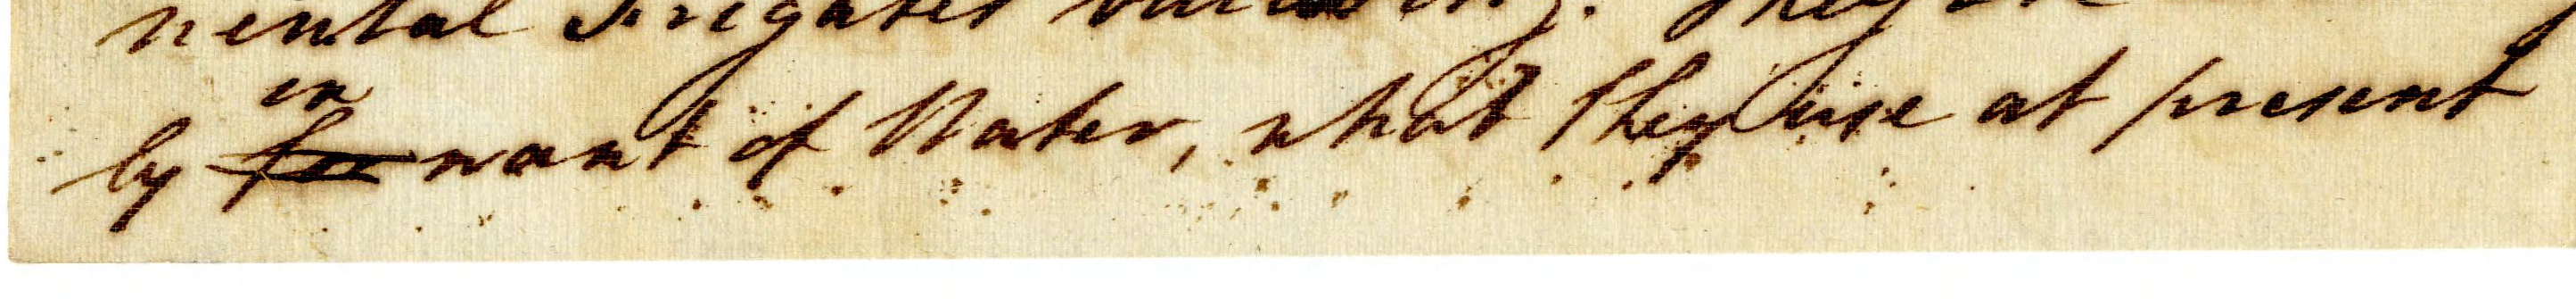ly [for] want of Water, what they use at present
